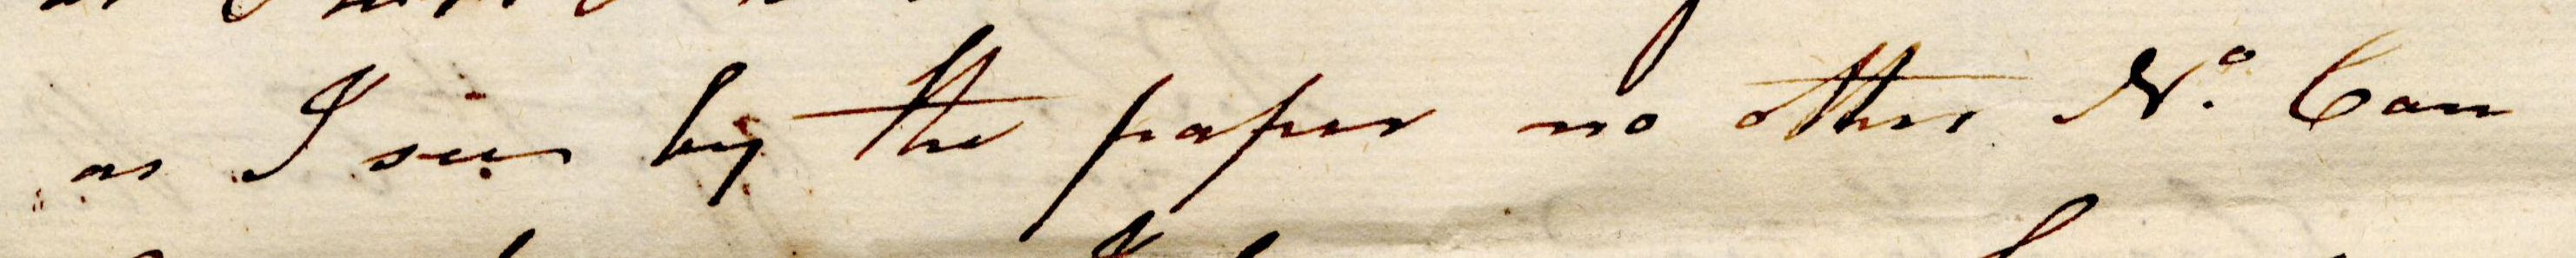as I see by the paper no othes N^o. Can
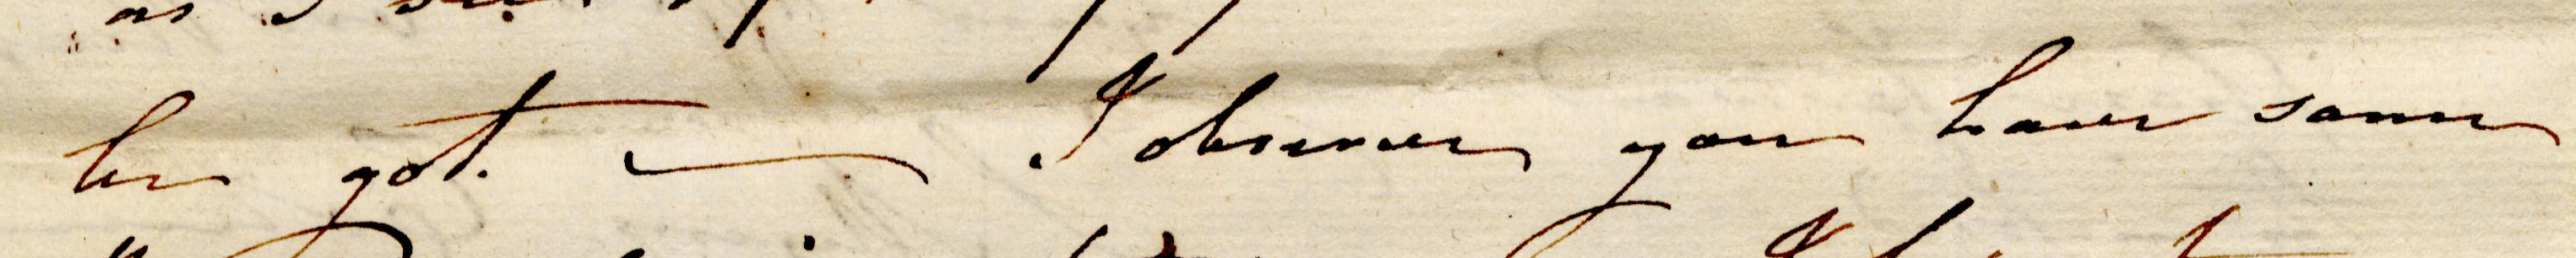be got.- I observe you have some
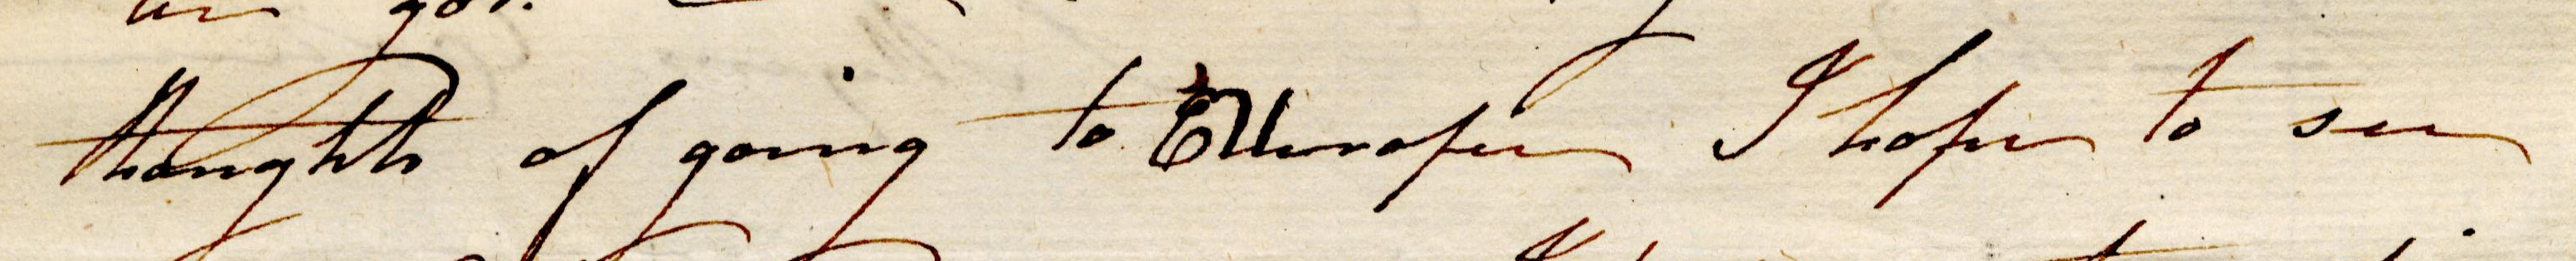thoughts of going to Chester.- I hope to see
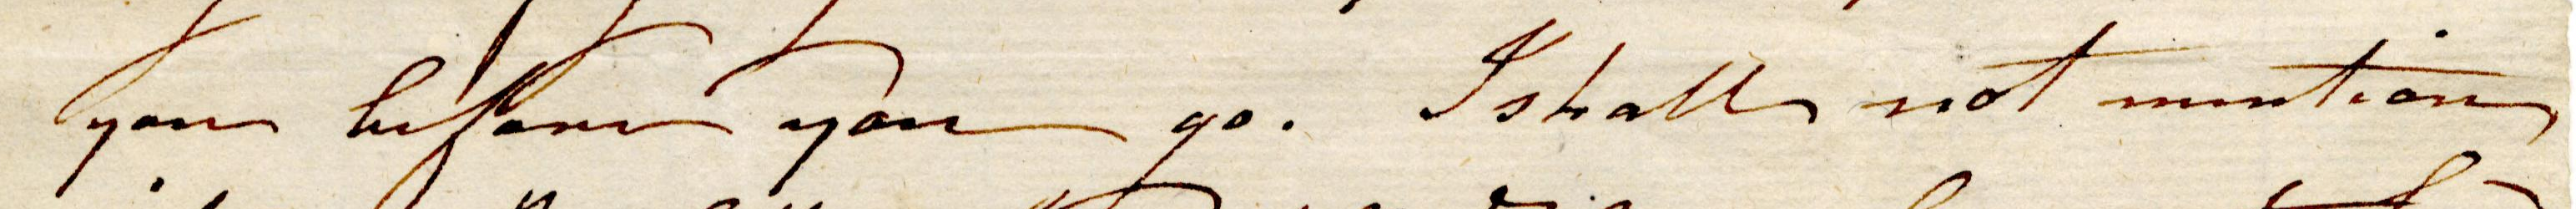you before youu go. I shall not mention
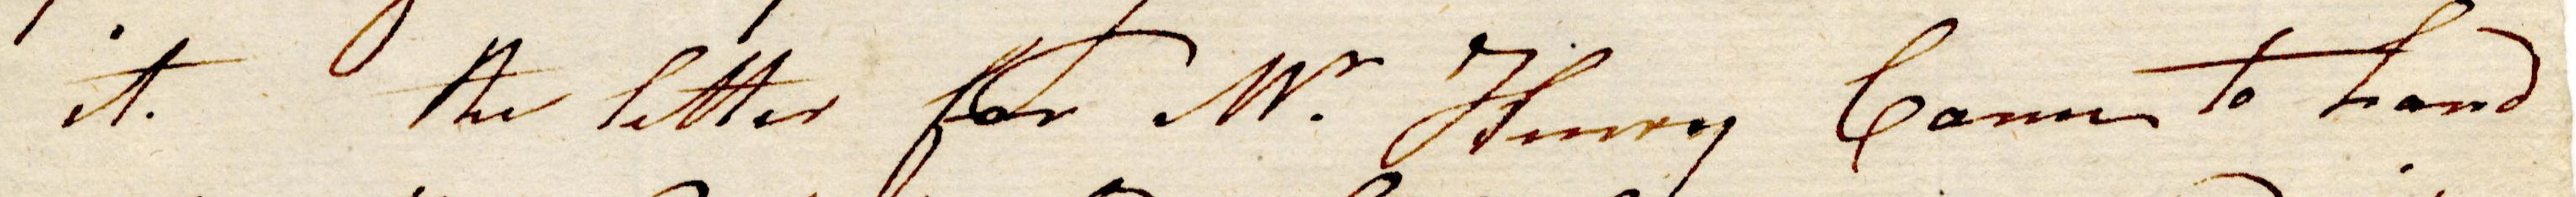it. the letter for M^r. Henry Came to hand
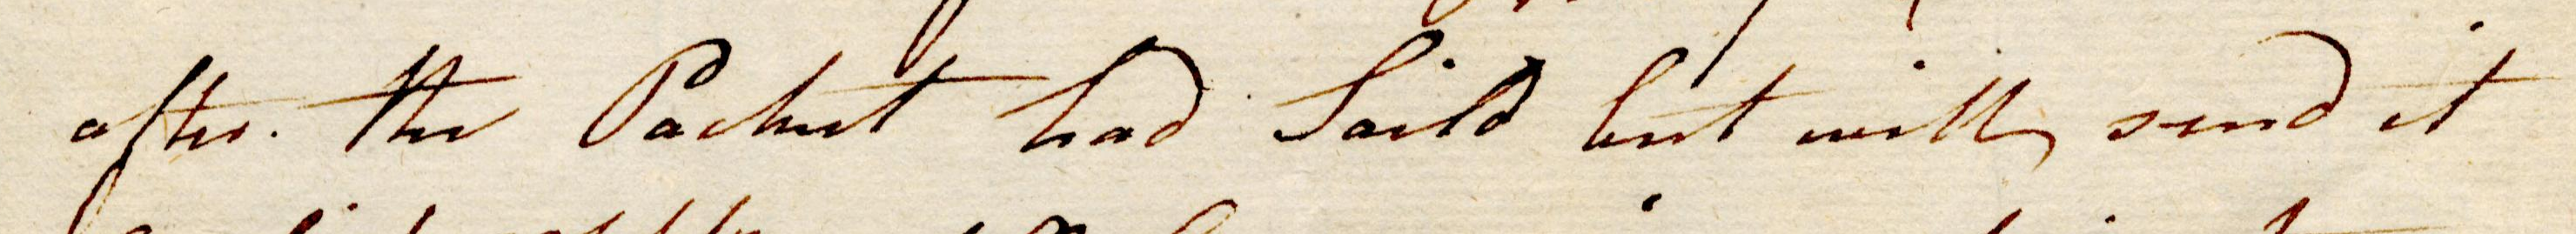after. the Pachet had Saild but will send it
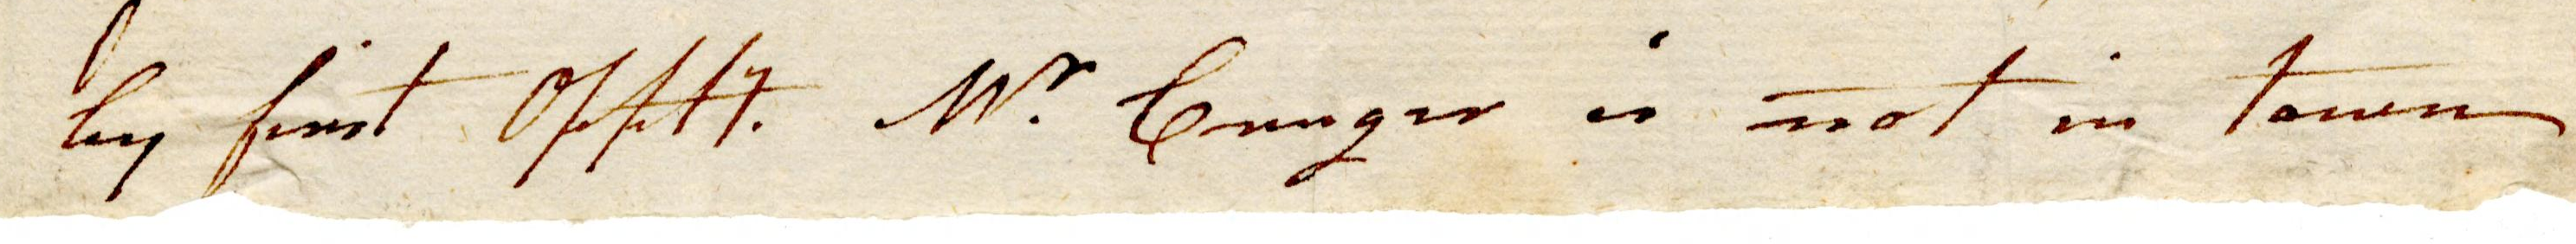by first oppt^y. M^r. Cunger is not in town
